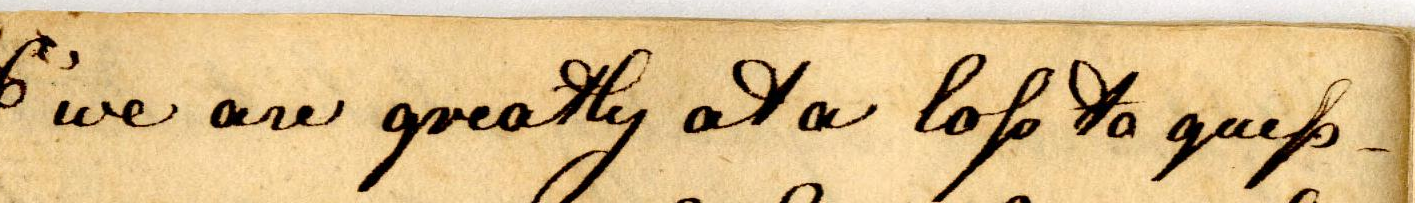56 we are greatly at a loss to quess-
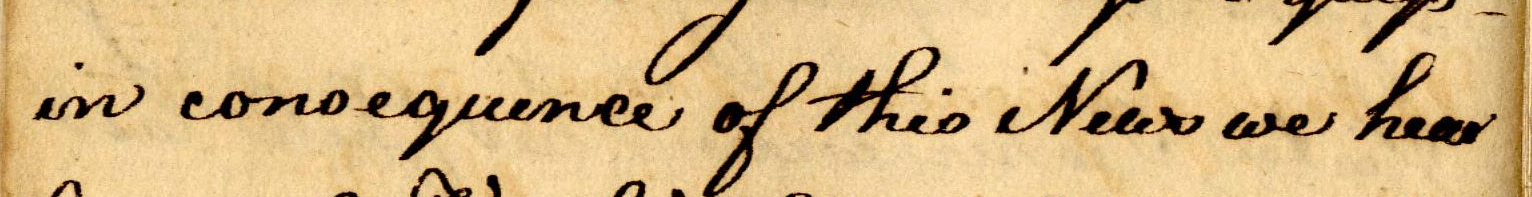in consequence of this News we hear
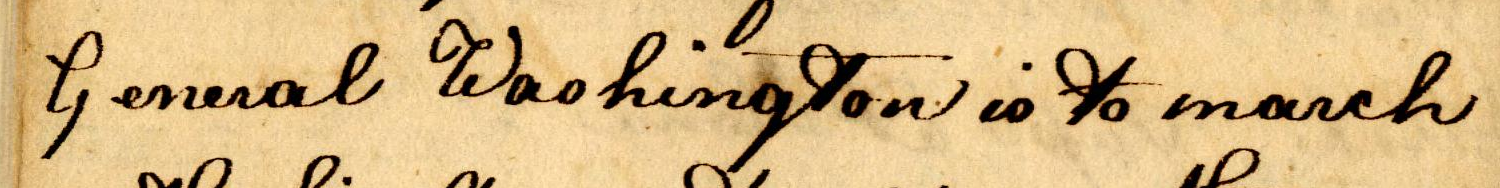General Washington is to march
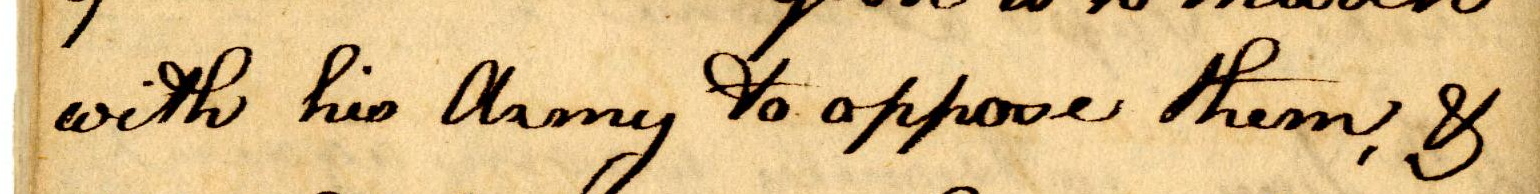with his Army to oppose them, &
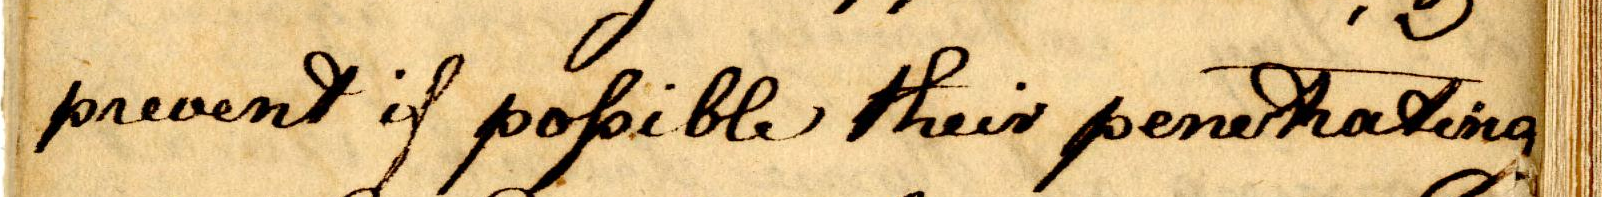prevent if possible their penetrating
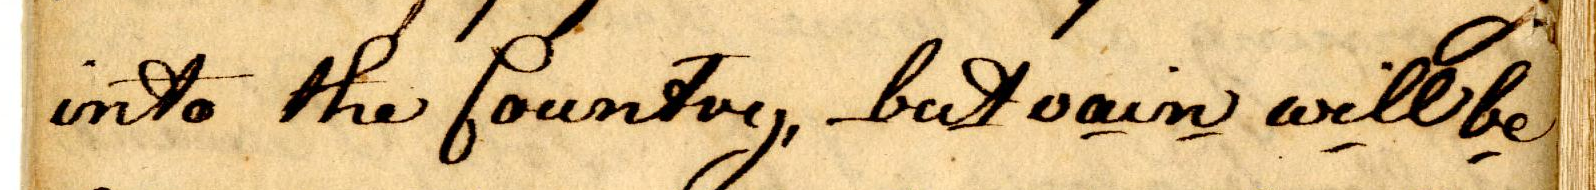into the Country, but vain will be
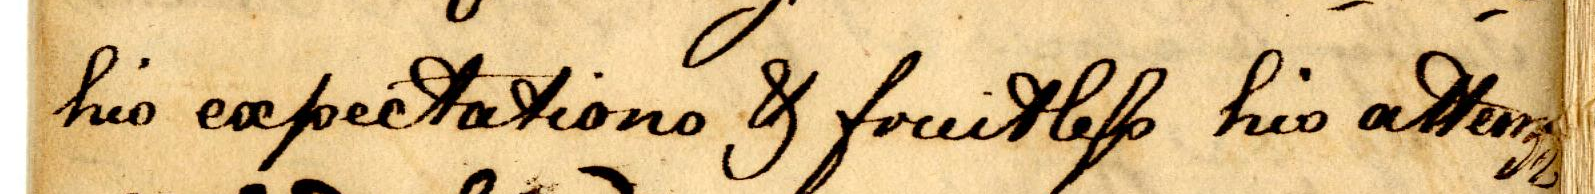his expectations & fruitless his atteng
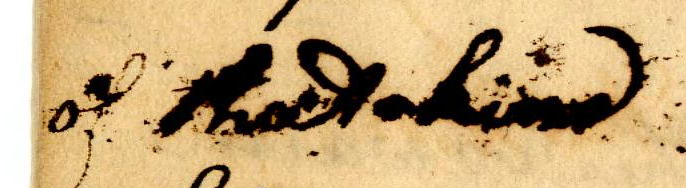of that kind
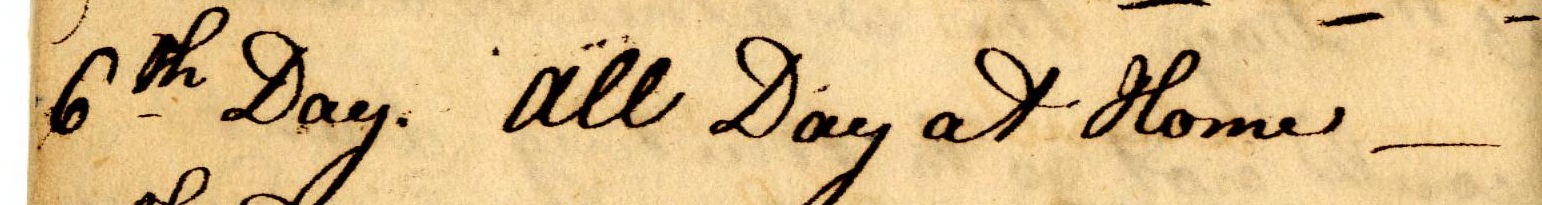6^th Day. All day at Home-
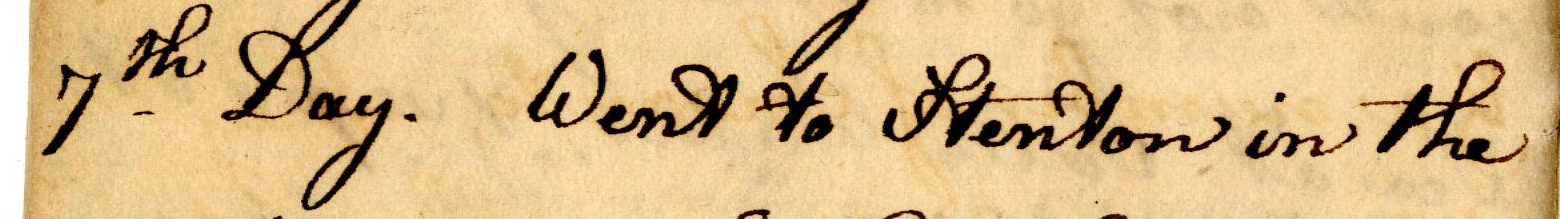7^th Day. Went to Stenton in the
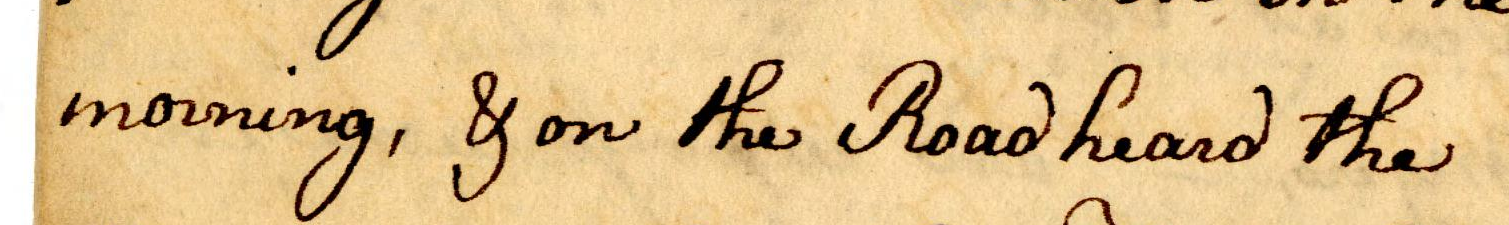morning, & on the Road heard the
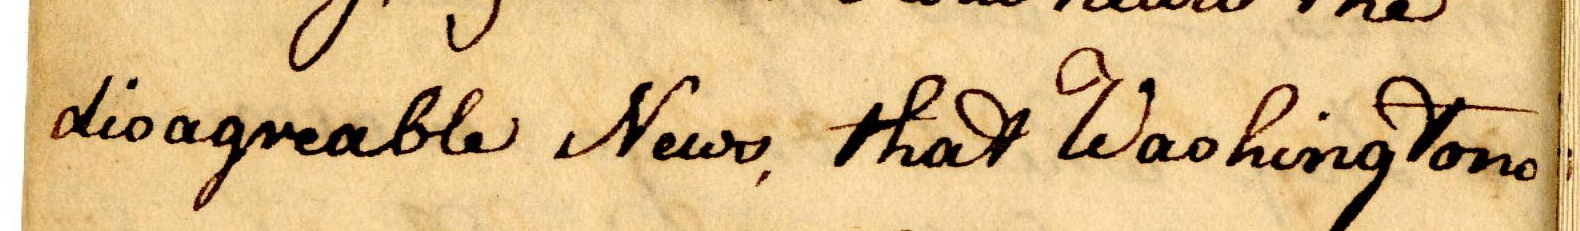disagreable News, that Washingtons
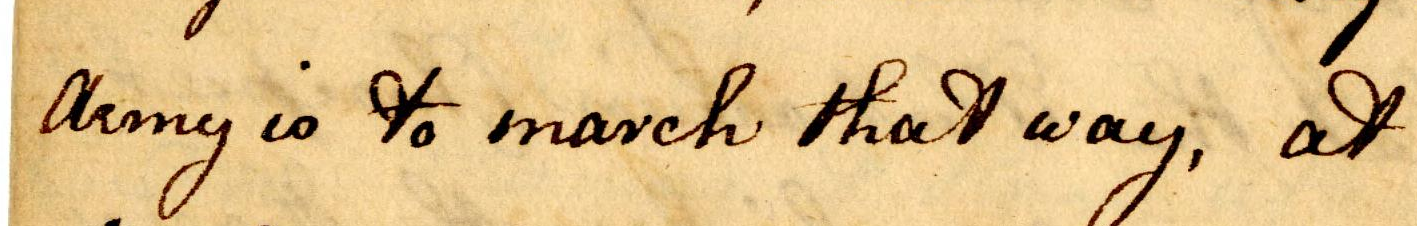Army is to march that way, at
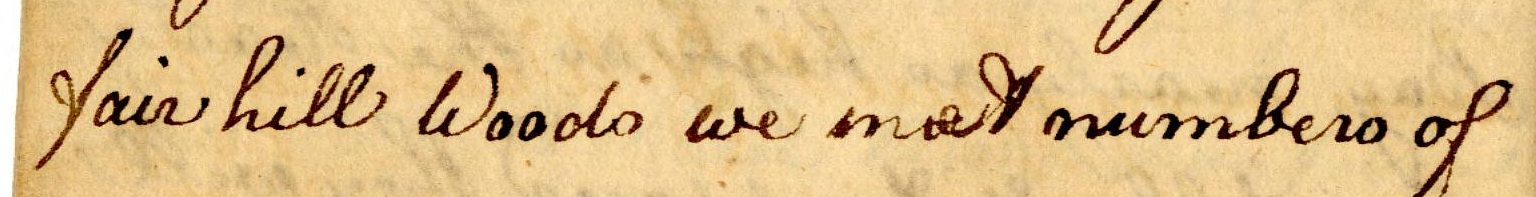fair hill Woods we met numbers of
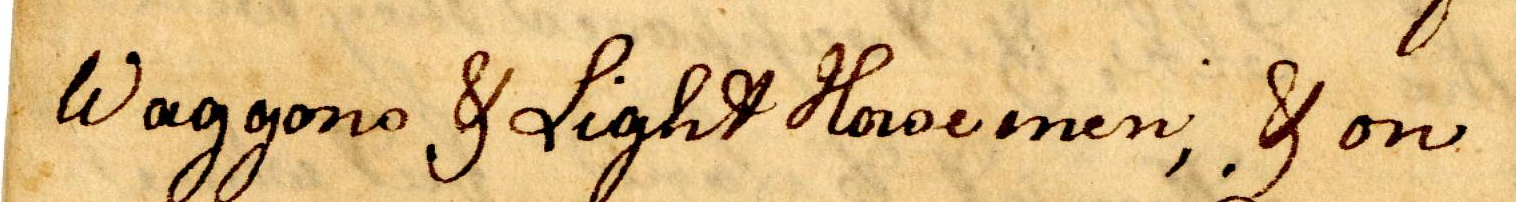Waggons & Light Horse men, & on
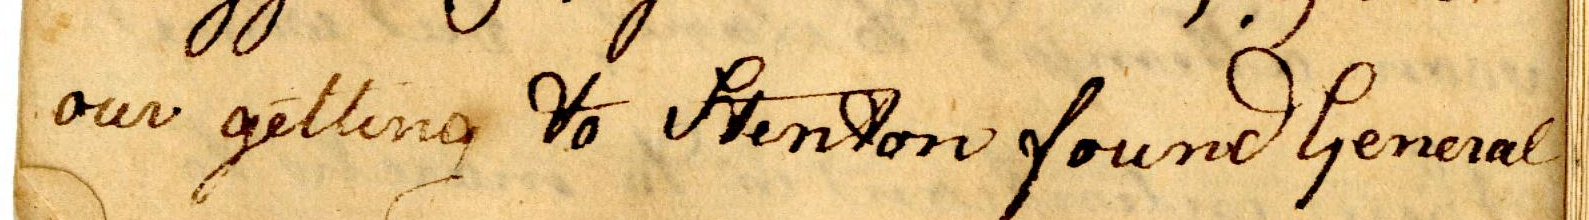our getting to Stenton found General
